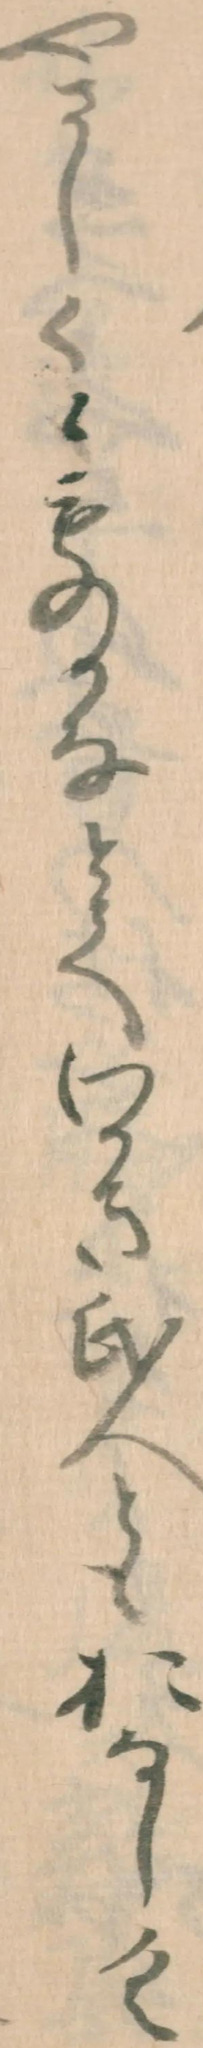やさしく候ものかなとてわかき氏人ともおなしく
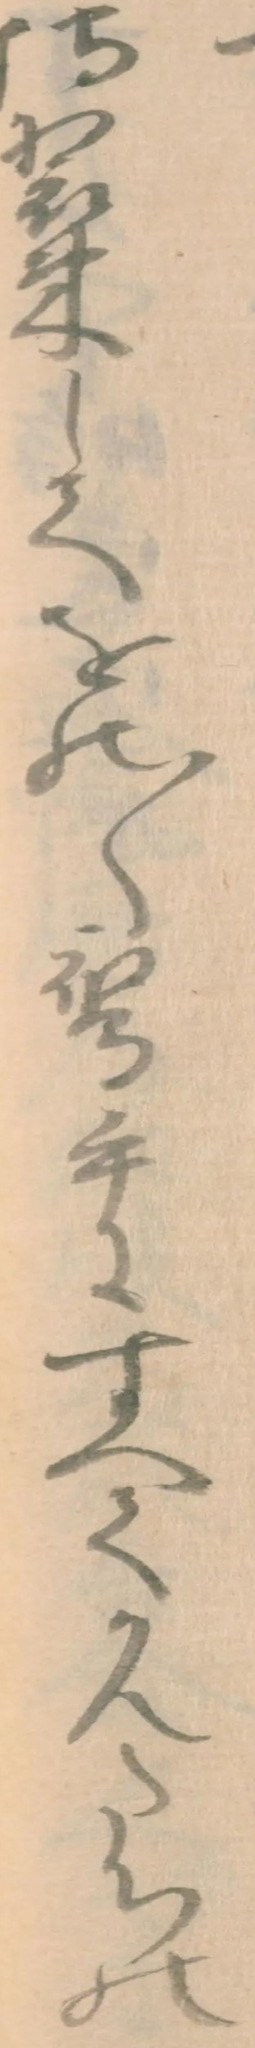狩装束してをの〳〵鷹手にすへてかんたちの
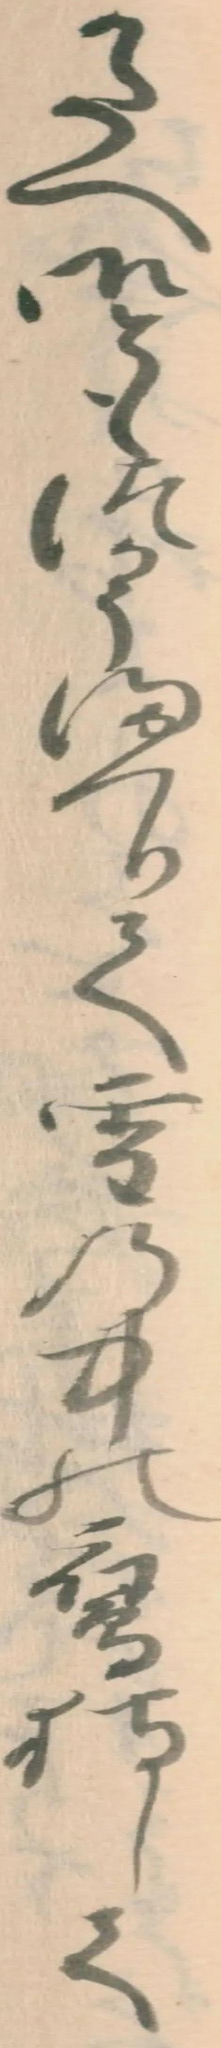かたへ御ともつかうまつりて雪の中の鷹狩して
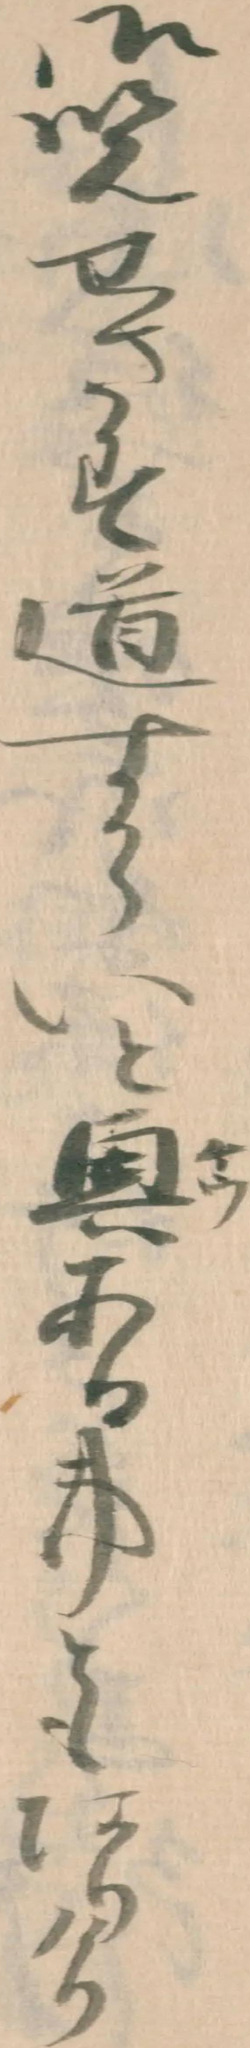御覧せさす道すからいと興ある事ともありけり
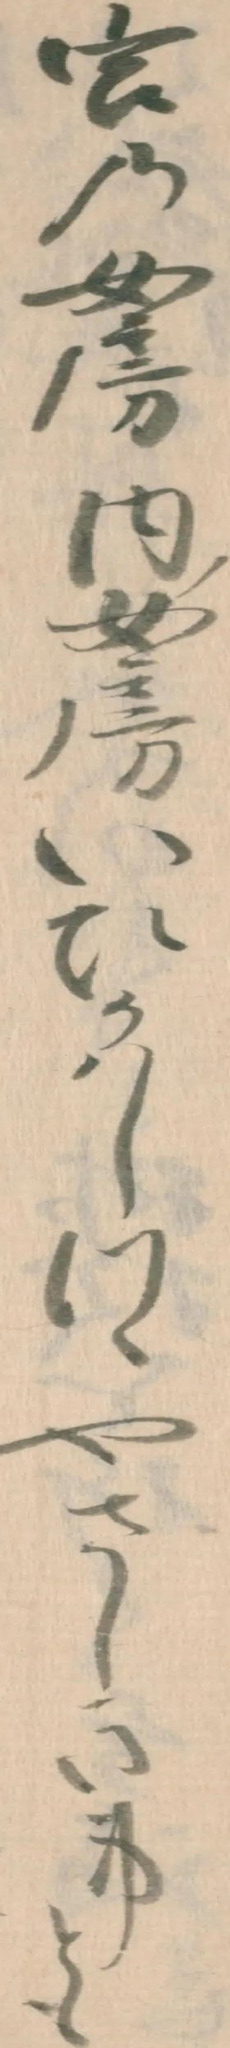宮の女房内女房いひかはしつゝやさしき事とも
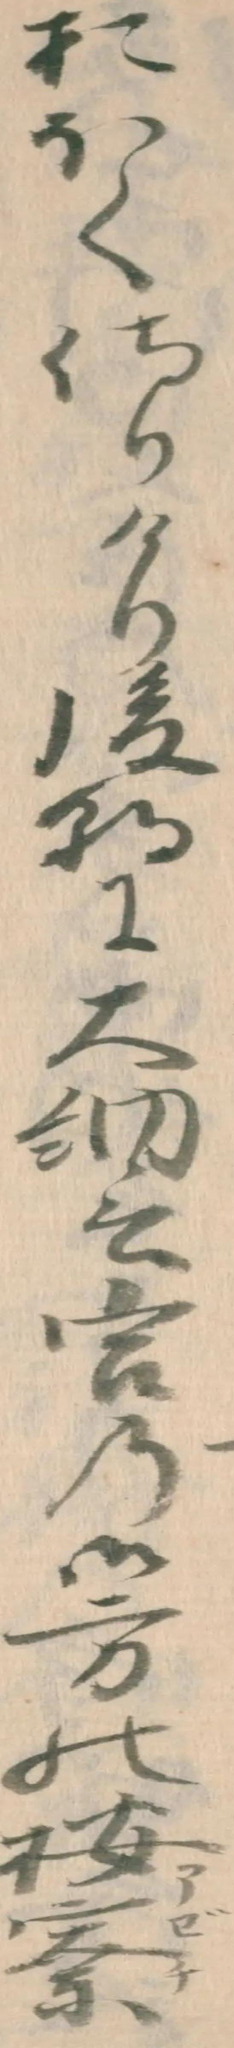おほく侍りけり後朝に大納言宮の御方の按察
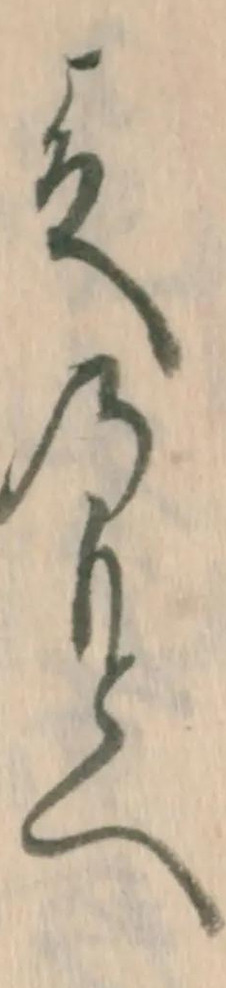殿のもとへ
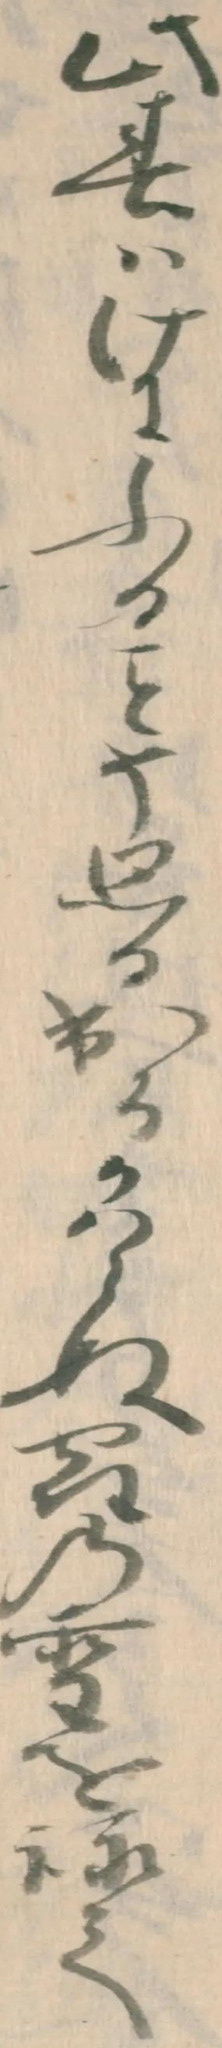此春はけにふることそ思ひ出るかはらぬ宿の雪を詠て
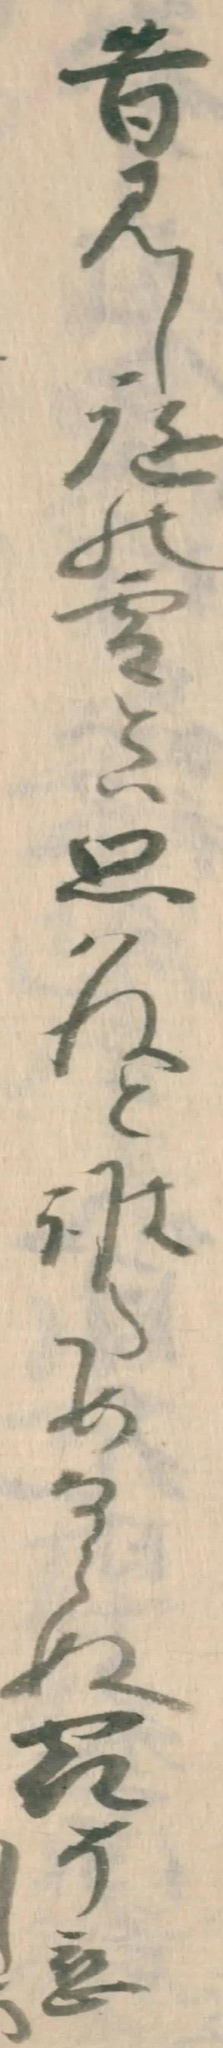昔見し庭の雪とは思はねと誰ためならぬ宿そ恋しき
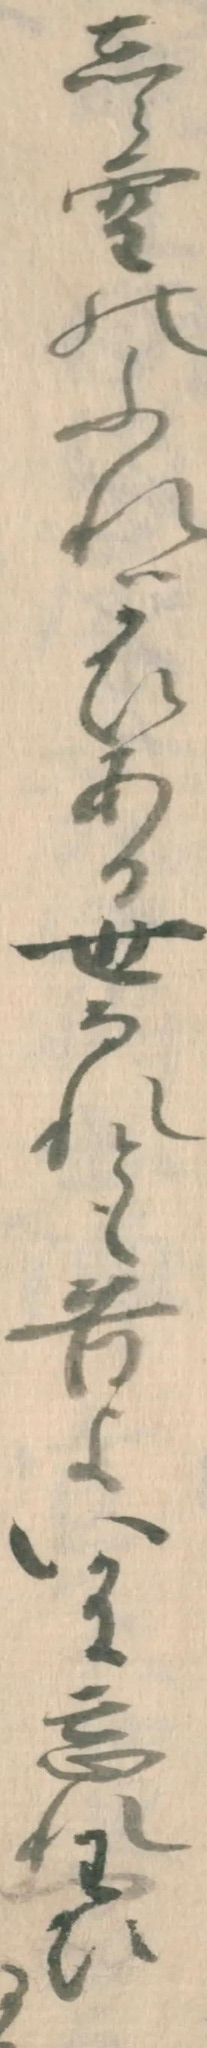しら雪のふれはかひある世なれとも昔よいかに忘れわひぬる
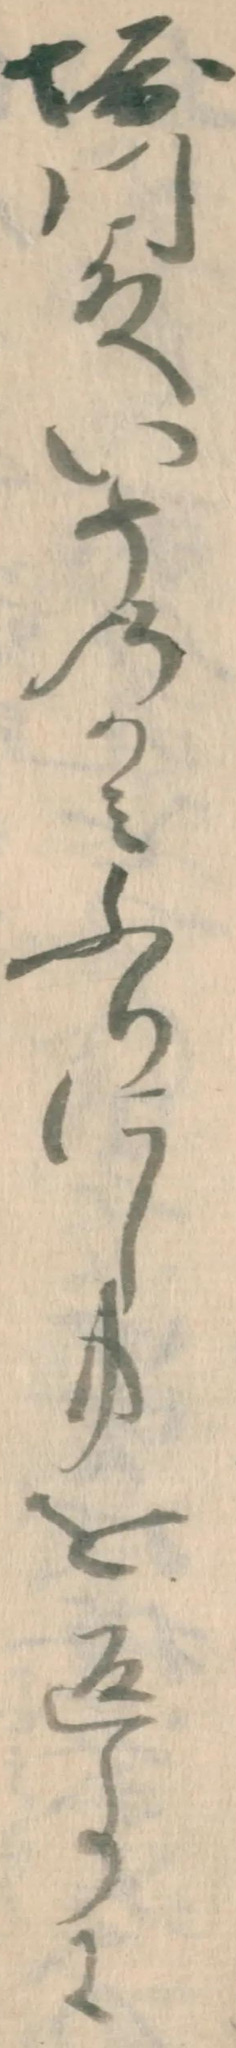堀川殿いそのかみふりにし事を返事に
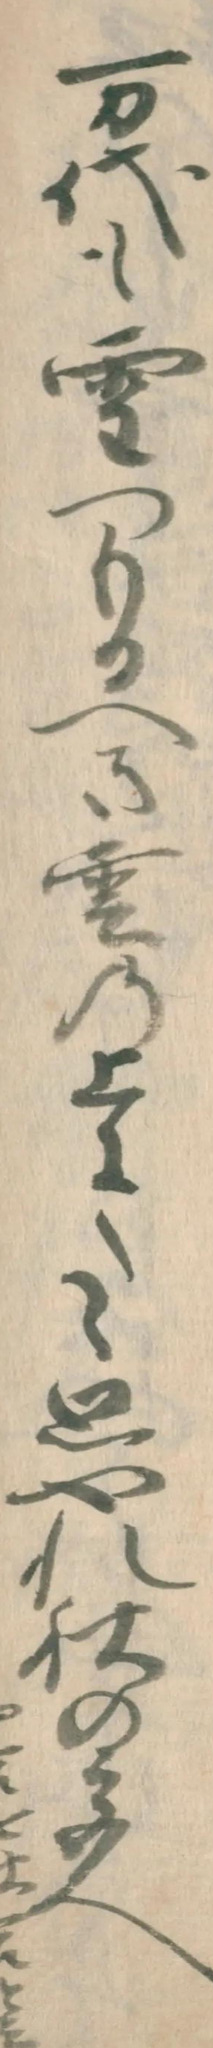万代も雪つもるへき雲の上にたゝ思やれ秋の宮人

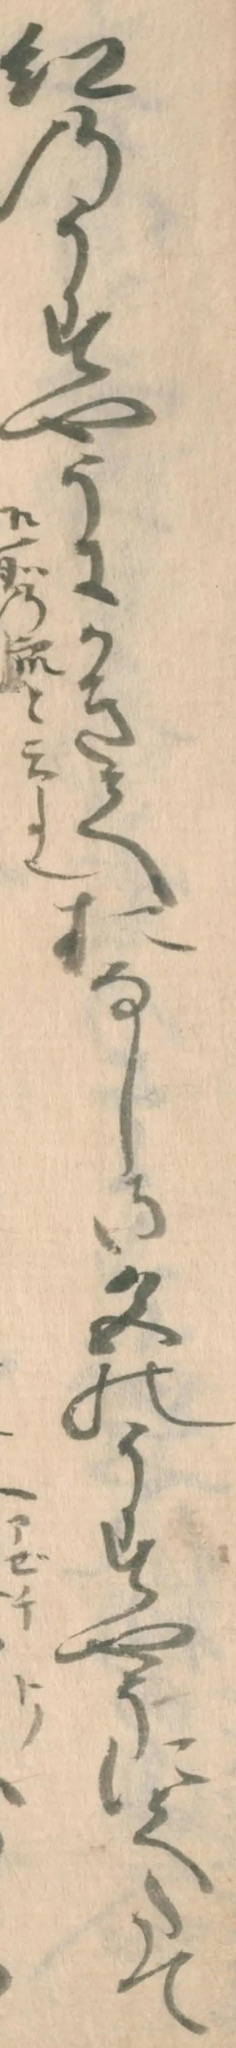紅のうすやうにかきておなしき色のうすやうにてたて
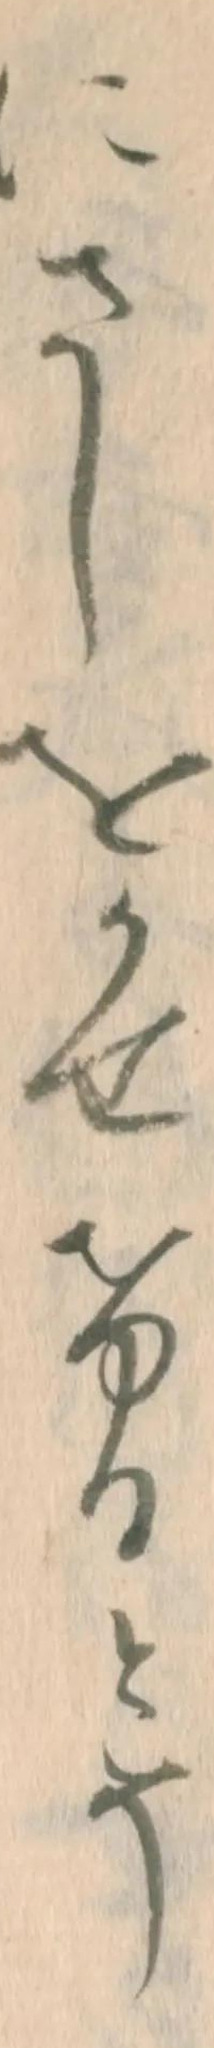にさしをかせけるとそ
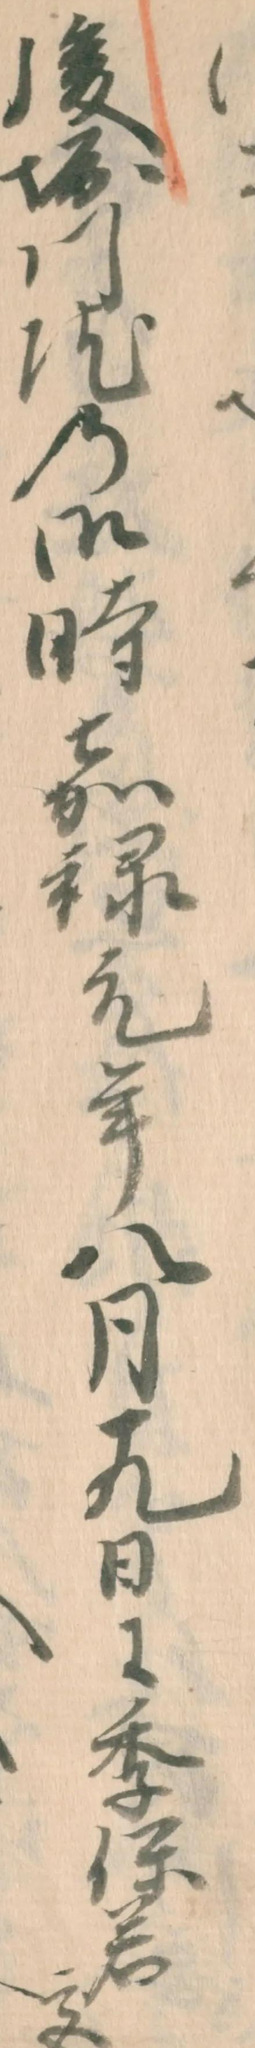後堀川院の御時嘉禄元年八月十九日に季保若宮
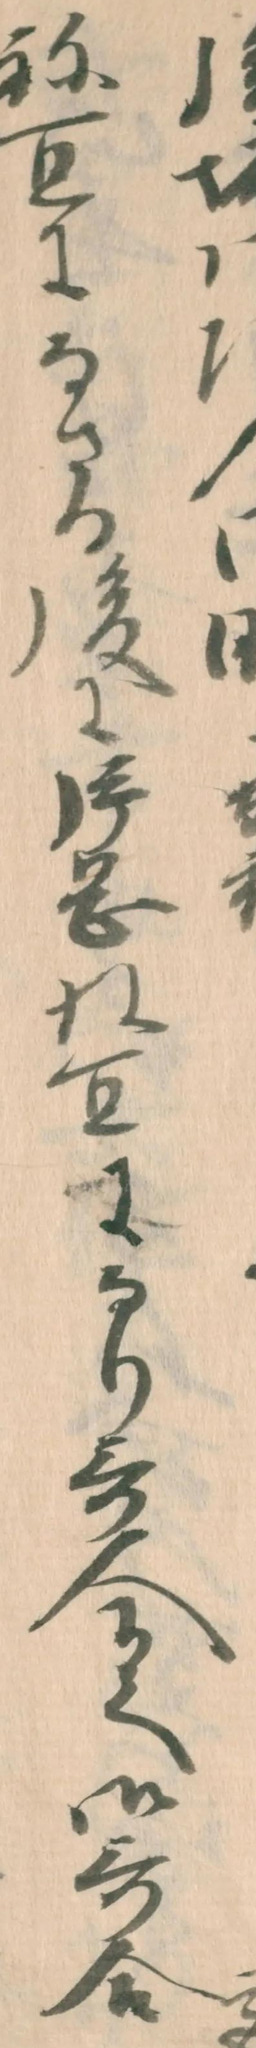祢宜になさる後に片岡ね宜になり哥人にて御哥合
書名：賀茂社記録. 第1冊
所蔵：国立国会図書館 National Diet Library, JAPAN
